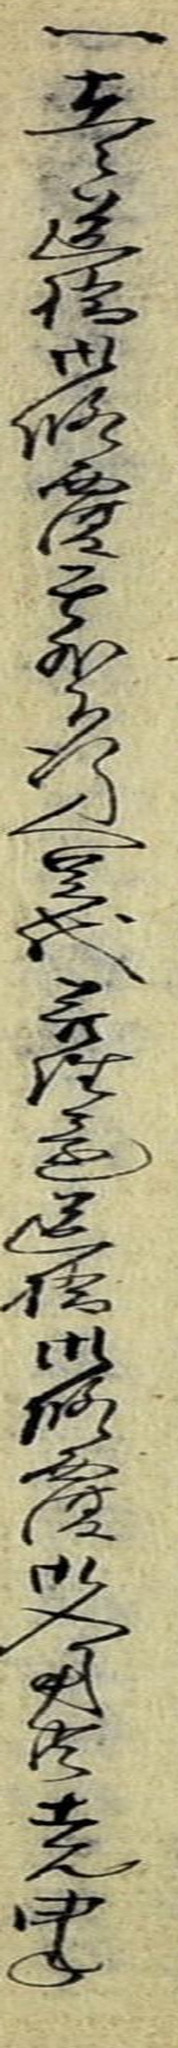一在々道橋御修覆其外下行人足代并往還道橋御修覆御入用共去申年
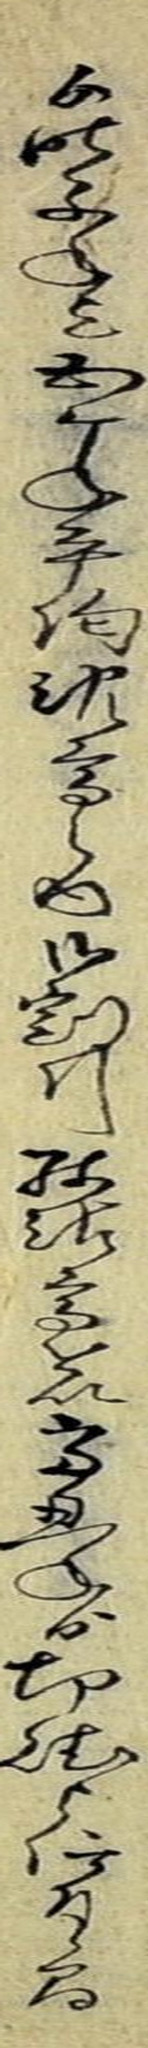ゟ昨子年迄五ヶ年平均銀高之内御割引残銀高を以当丑年ゟ切賦被仰付候間
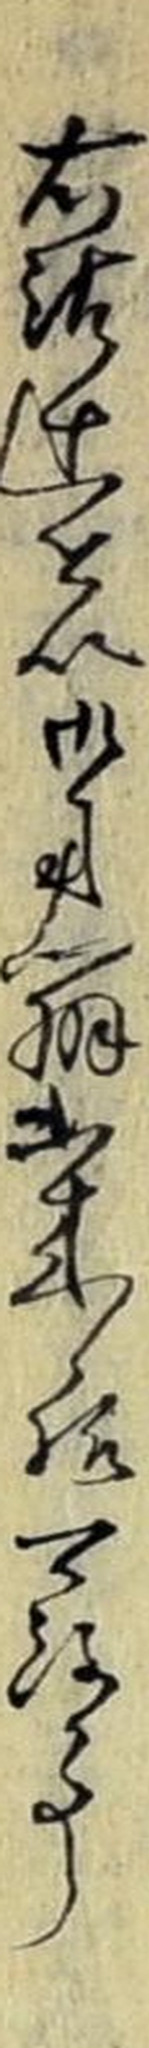右銀辻を以御用弁出来候様可致事
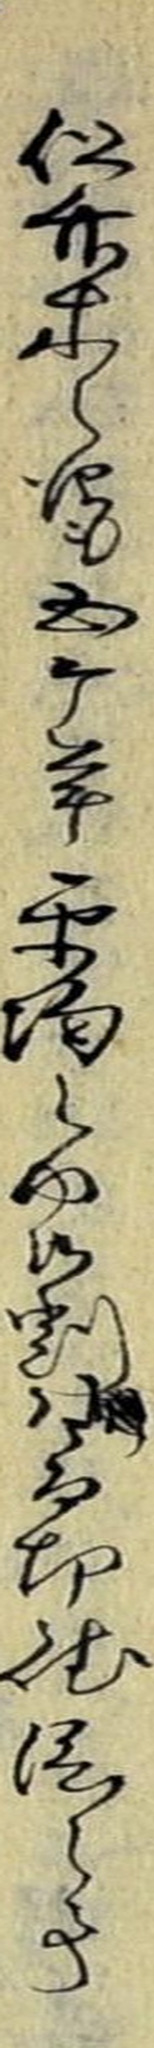但竹木之儀も五ヶ年平均之内御割引に而切賦渡之事
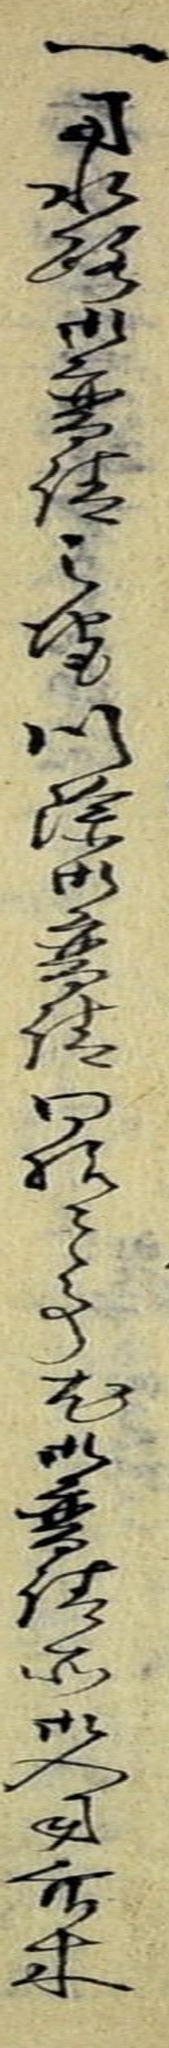一用水路御普請之儀も川除御奉行同様に候事尤御普請所御入用竹木
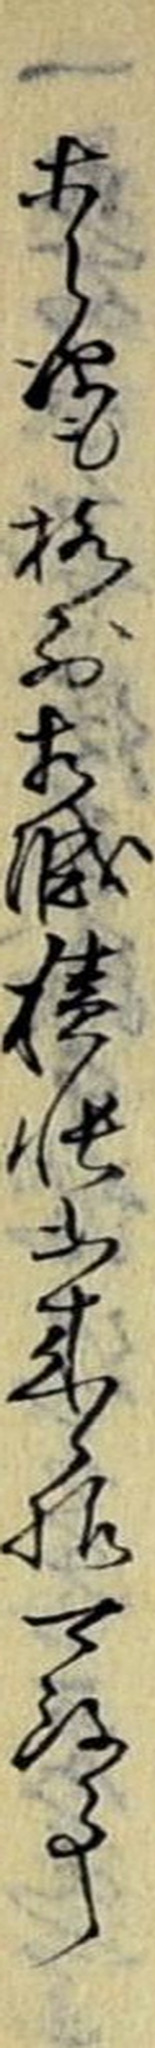等之儀も格別相減積帳出来候様可致事
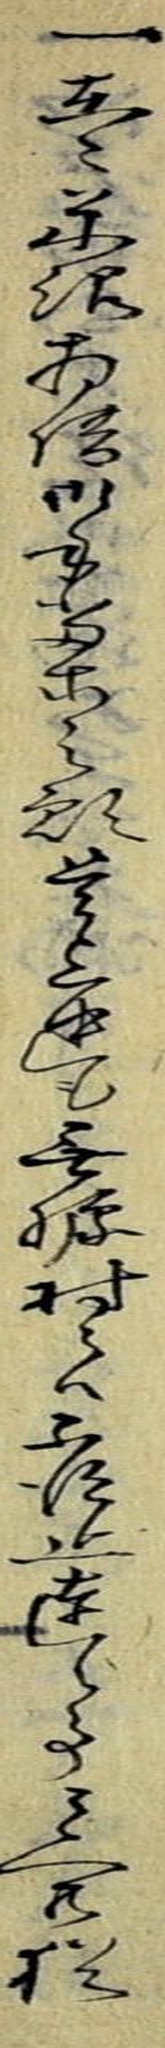一在々米銀拝借御手当等之願是迄迚も無拠村々は不得止達候事に候へ共猶
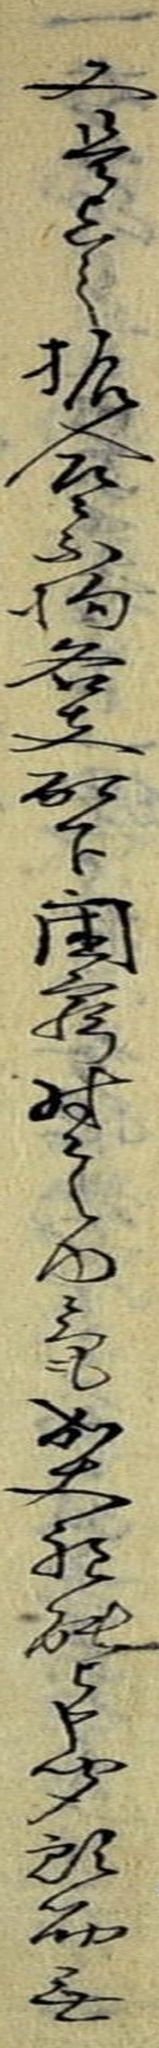又是迄之振合に不拘各支配下困窮之村々之内に而も成丈程能被申聞願筋無
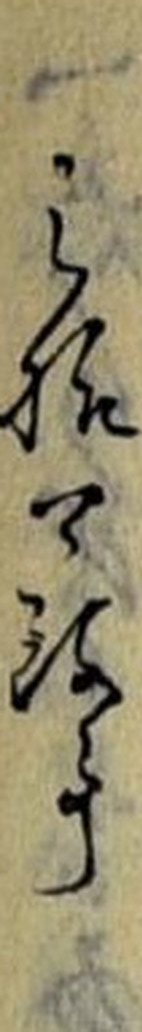之様可致事
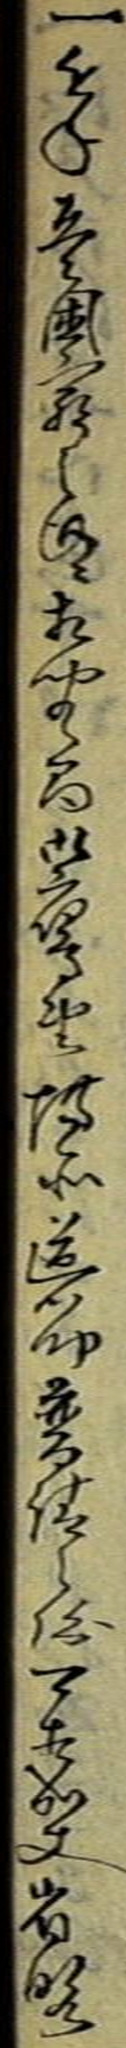一近年在々困窮之儀も相聞候間御鷹野場所道筋普請之儀可相成丈御省略
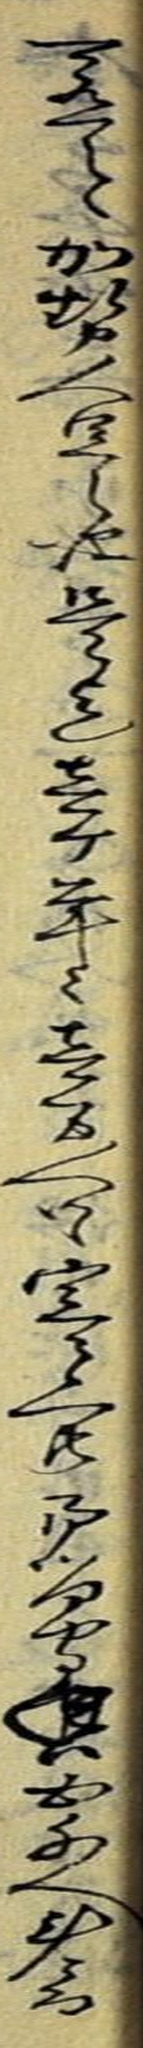可有之候加勢人足之儀是迄壱ヶ年に壱万人つヽ定候へ共御留守年は五千人斗に而
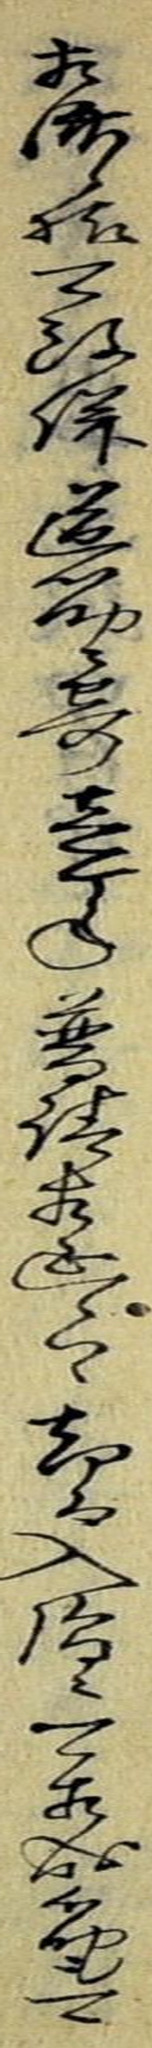相済候様可致併道筋に寄壱ヶ年普請相延候はヽ却而入増に可相成筋も可
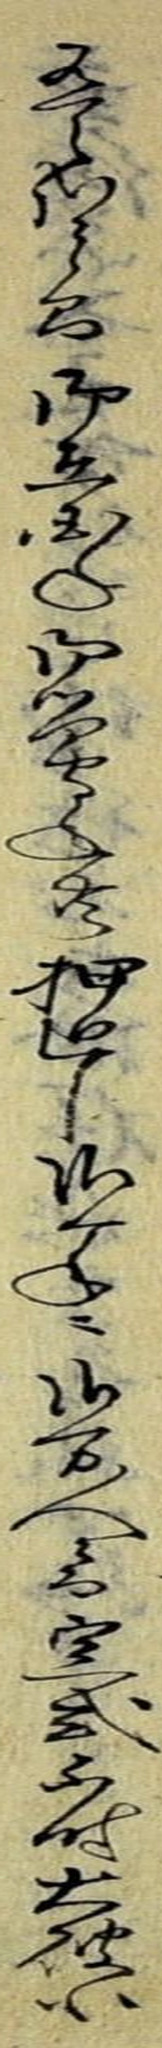有之哉に候間御在国年御留守共共押廻し弐ヶ年に弐万人に而定式不時大破小
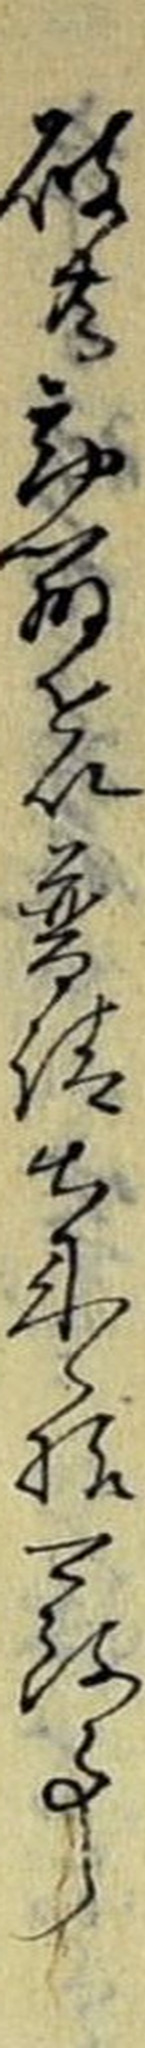破共勘弁を以普請出来候様可致事
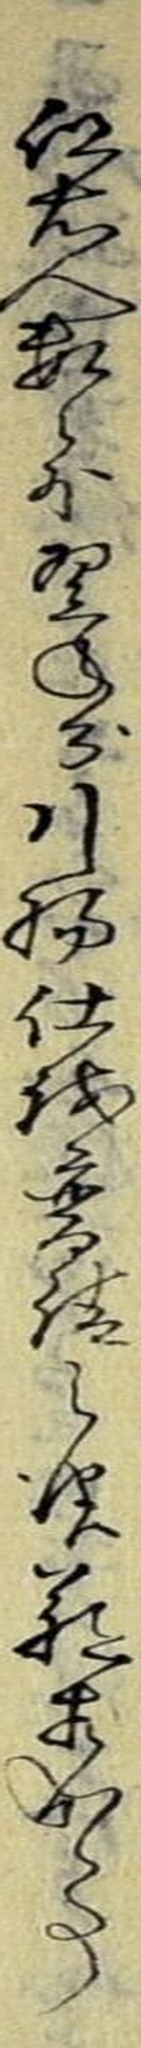但右人数之外翌年分引揚仕越普請之儀は難相成候事
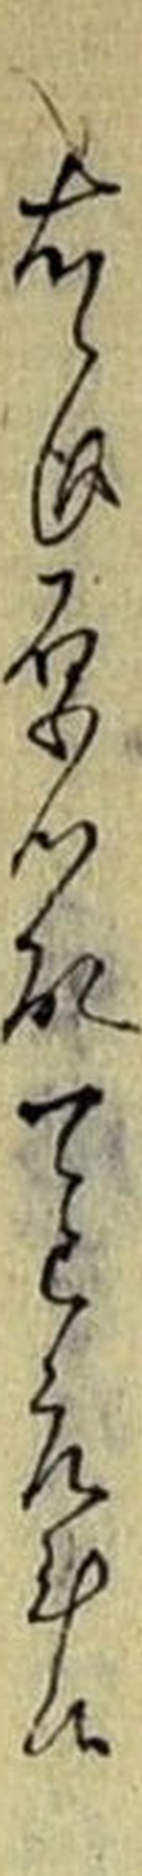右之趣厚心配可被取斗候
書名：命令之部 四
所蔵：福井県文書館 Fukui Prefectural Archives
